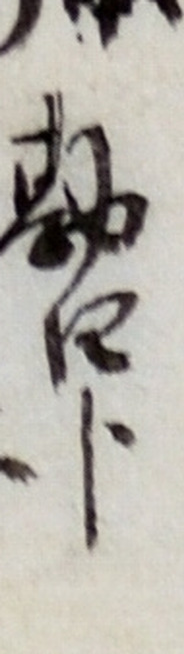勘四郎
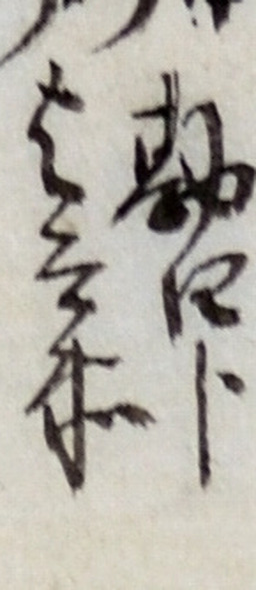又兵衛
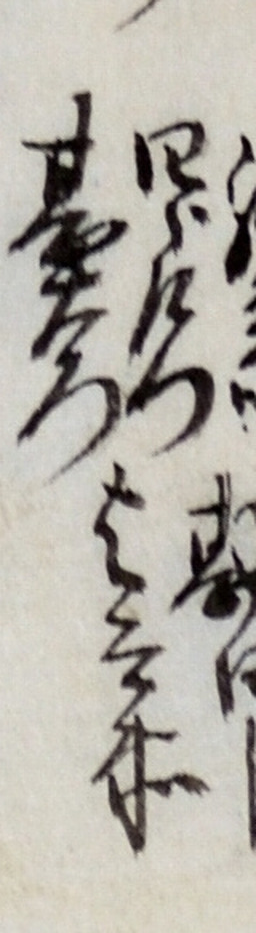四郎左衛門与兵衛
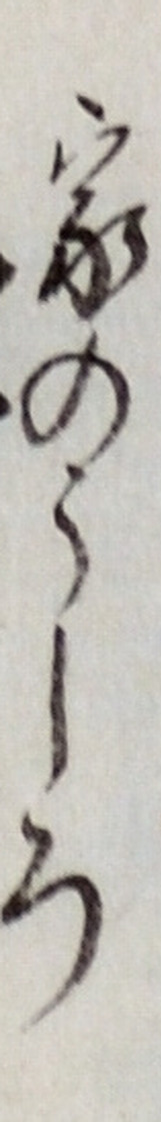家のうしろ
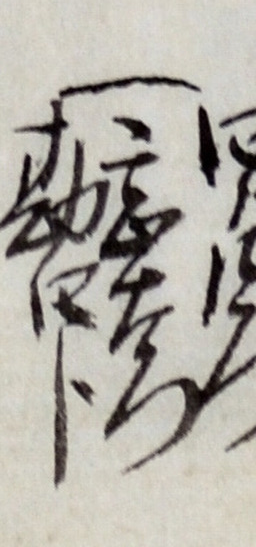甚左衛門
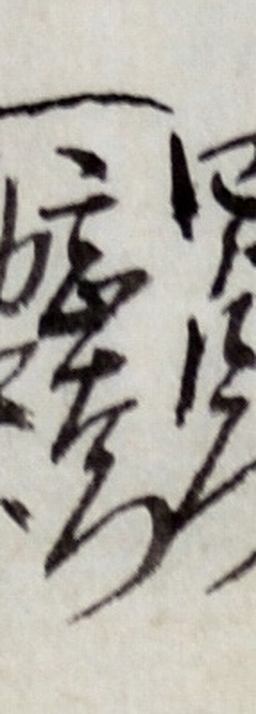甚右衛門
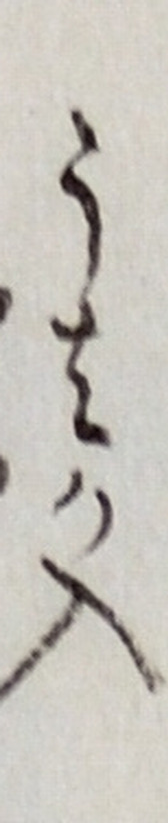うはか入
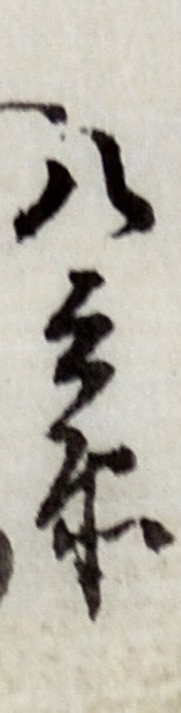八兵衛
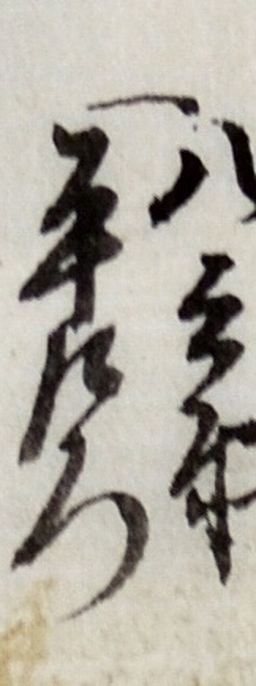平左衛門
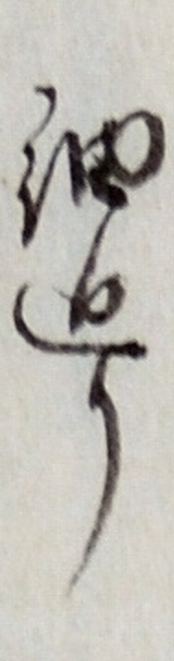細迫り
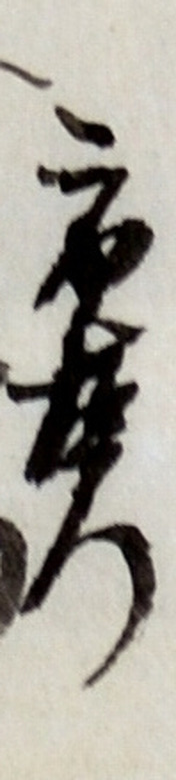甚右衛門
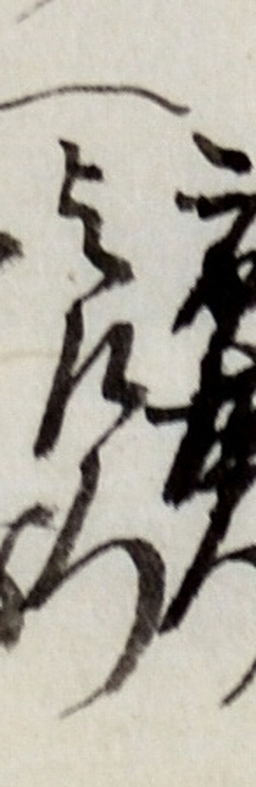与左衛門
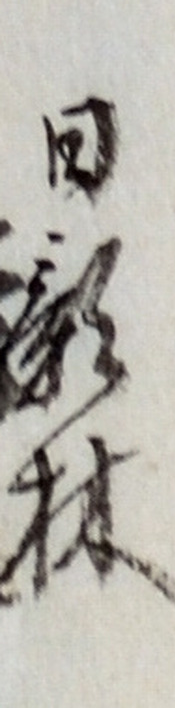日影林
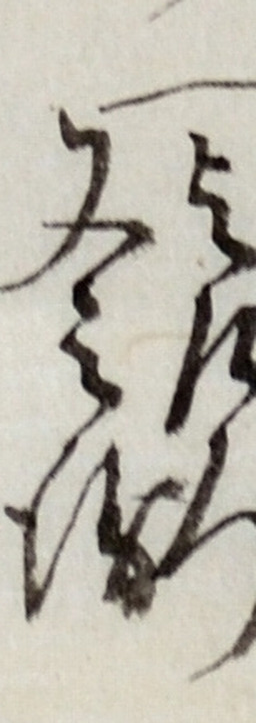又兵衛
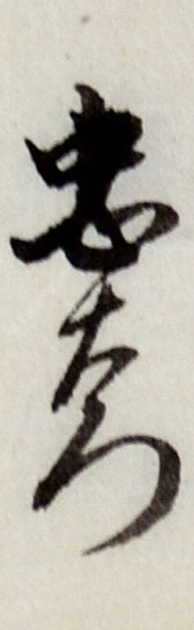忠右衛門
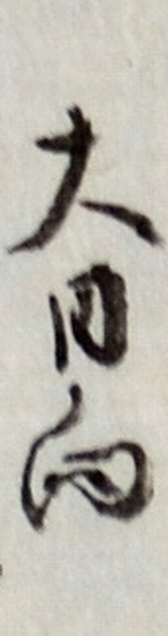大日向
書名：御領分中山林社地手控
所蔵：伊那市立高遠町図書館・合同会社AMANE
